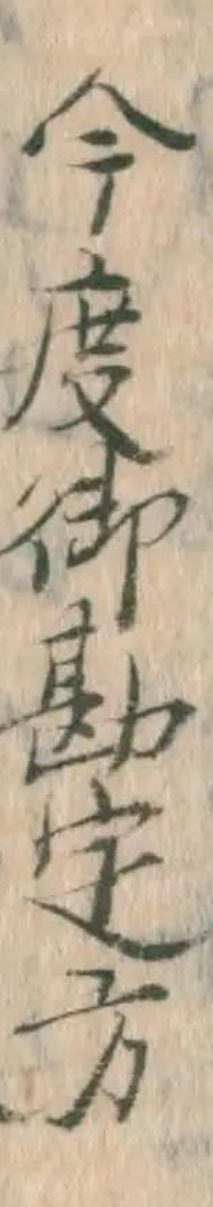今度御勘定方
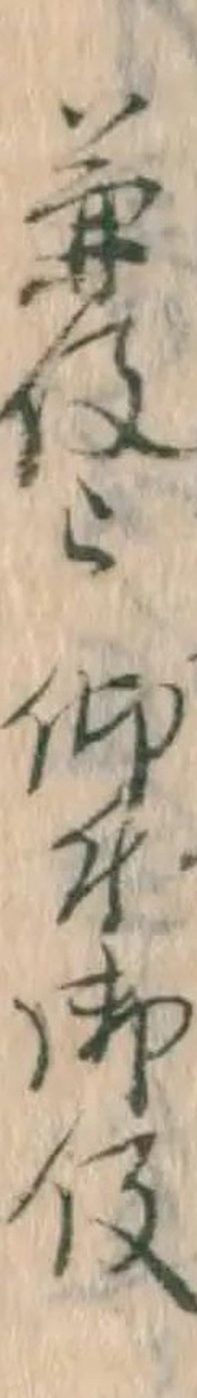兼役被仰付御役
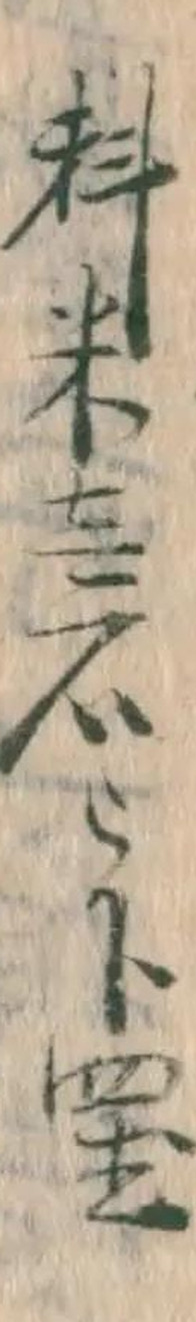科米壱石被下置
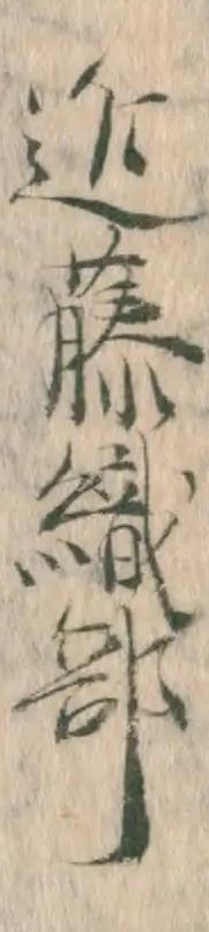近藤織部
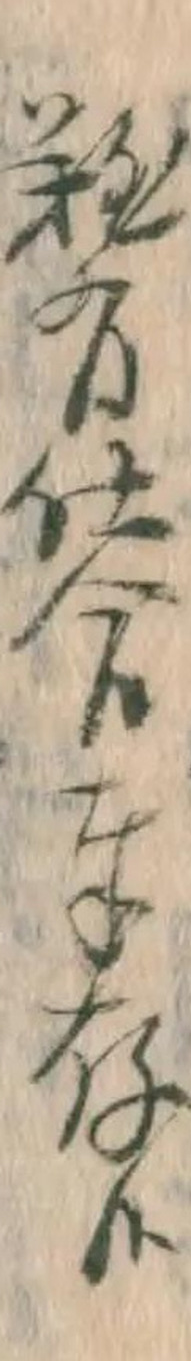難有仕合奉存候
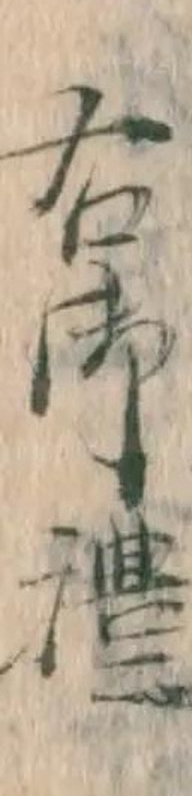右御禮
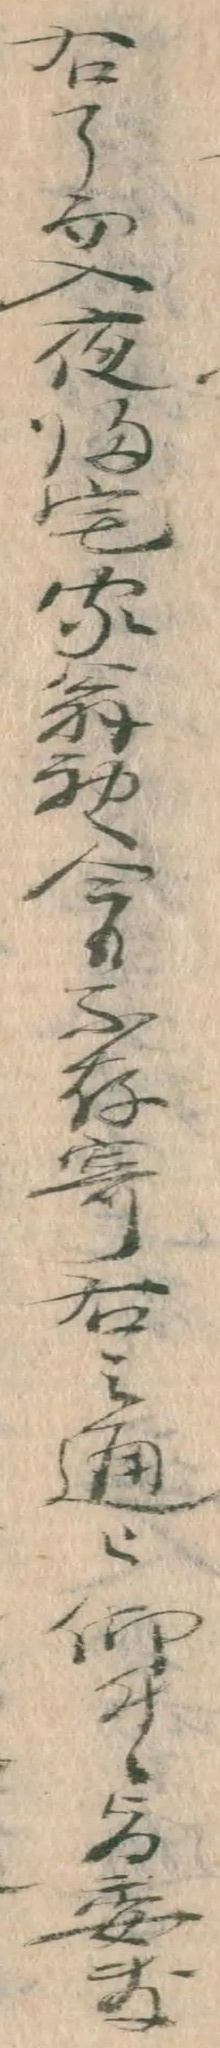右了而入夜帰宅家翁勤候へ今日不存寄右之通被仰付候旨委敷
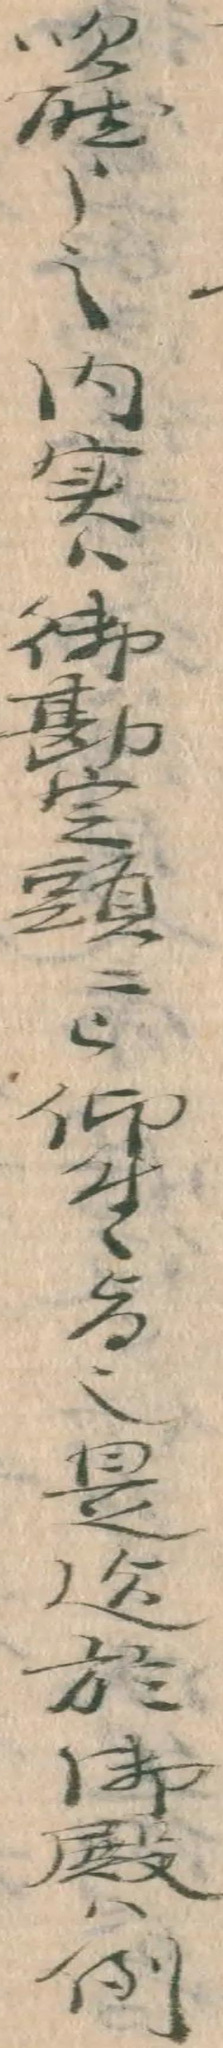吹聴申之内実ハ御勘定頭ニ被仰付候旨也是迄於御殿ハ例
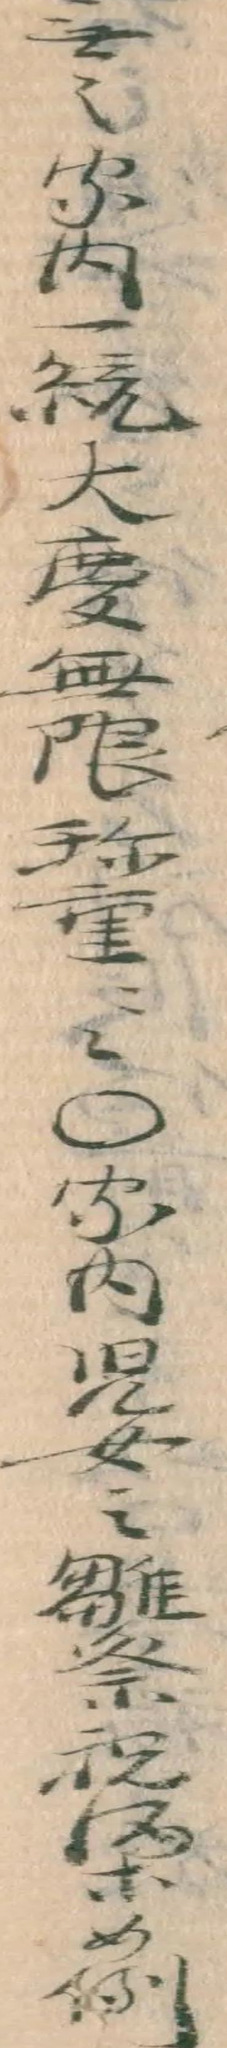無之家内一統大慶無限珎重〻〻〇家内児女之雛祭祝酒等如例
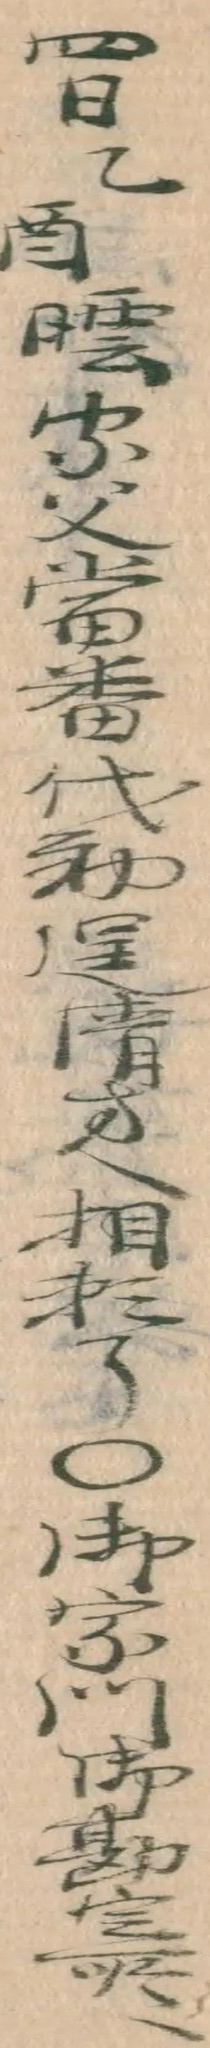四日乙酉曇家父當番代勅逞浄方へ相頼了○御家門御勘定所へ
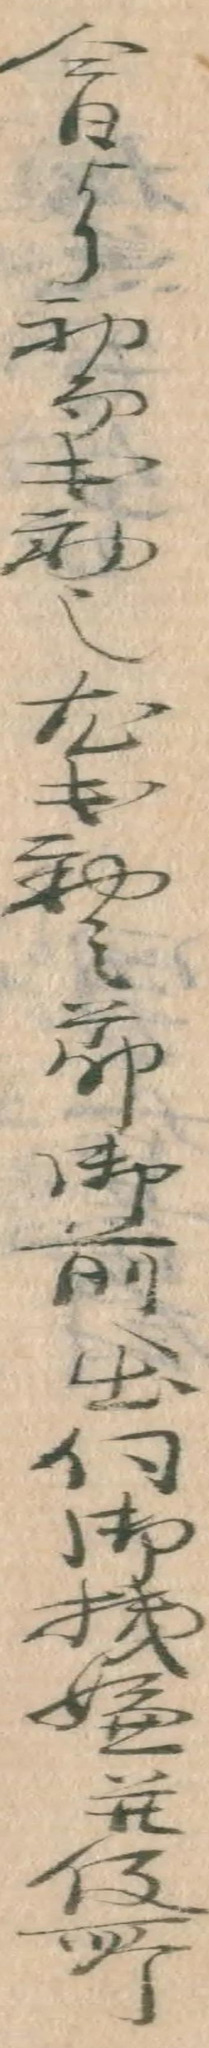今日より初而本勤也尤本勤之節御前へ出伺御機嫌并役所
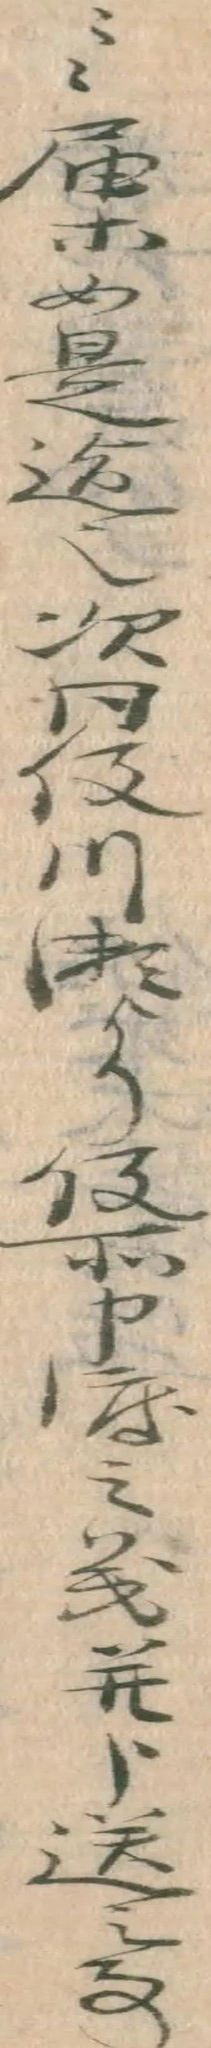々々届等如是迄也次同役川瀬より役所申渡之義并申送之事
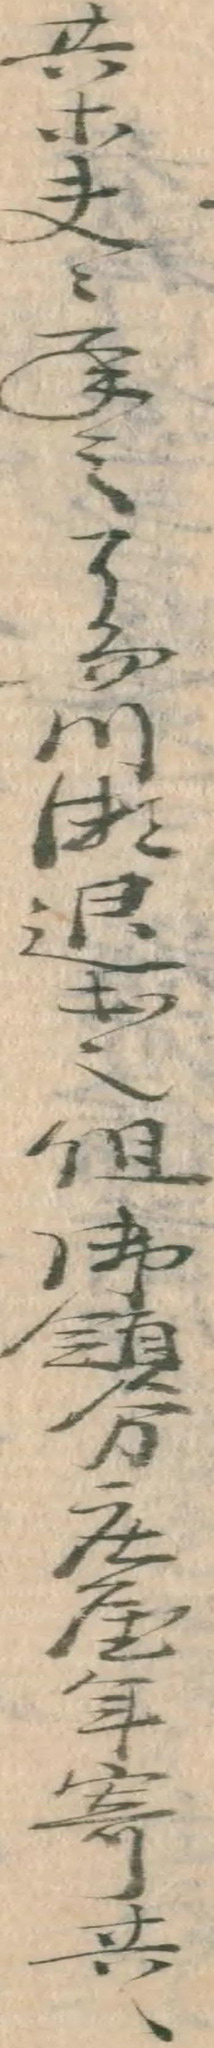共等夫々承之了而川瀬退出也但御領分庄屋年寄共へ
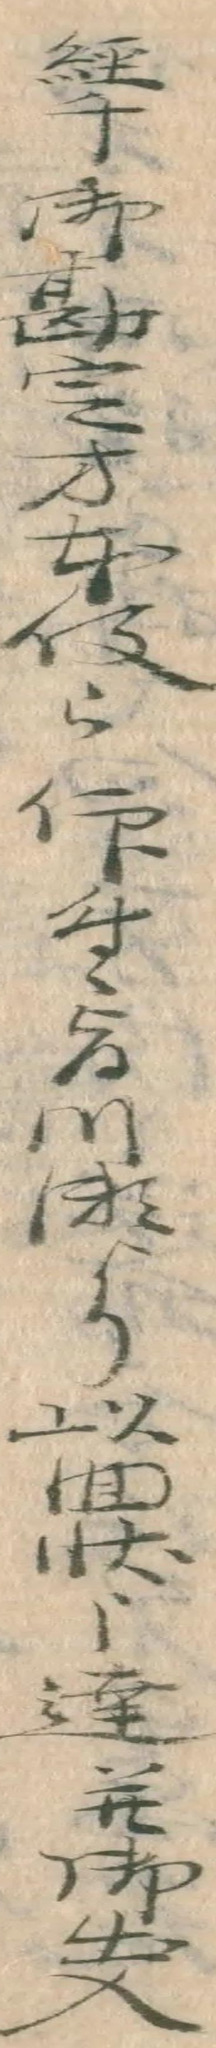経千御勘定方本役被仰付候旨川瀬より以回状申達并御出入
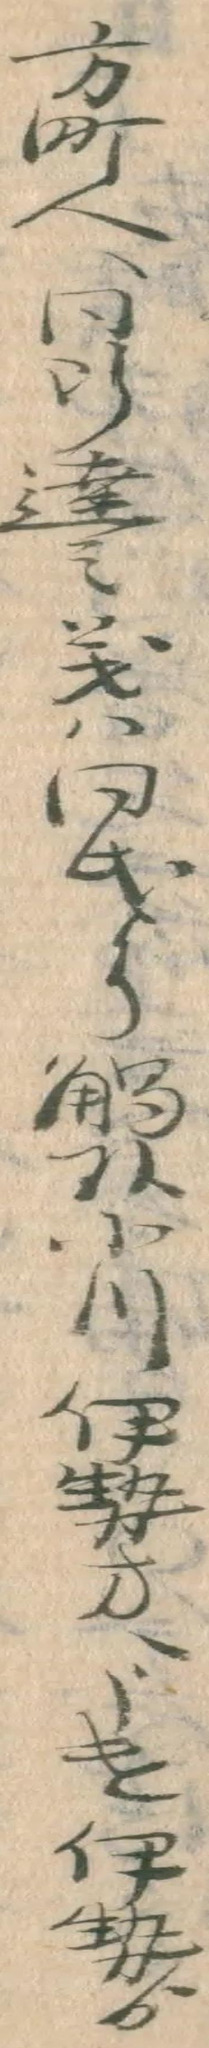方町人へ同断達之義は同氏より触頭小川伊勢方へ申遣伊勢ゟ
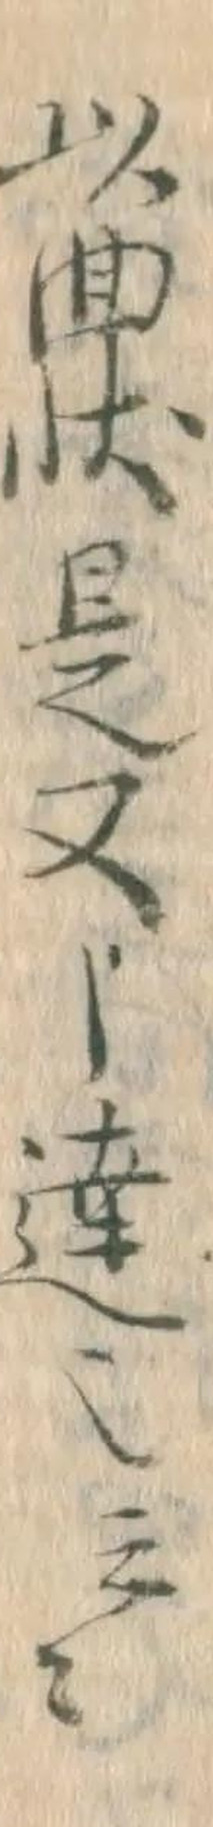以回状是又申達也云〻
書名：賀茂社記録. 第65冊
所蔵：国立国会図書館 National Diet Library, JAPAN
